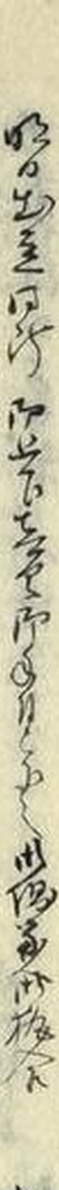明日出立同断御上下壱具御手自被下之御側御用人御執合
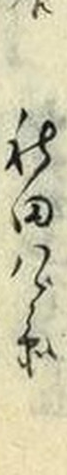同秋田八郎兵衛
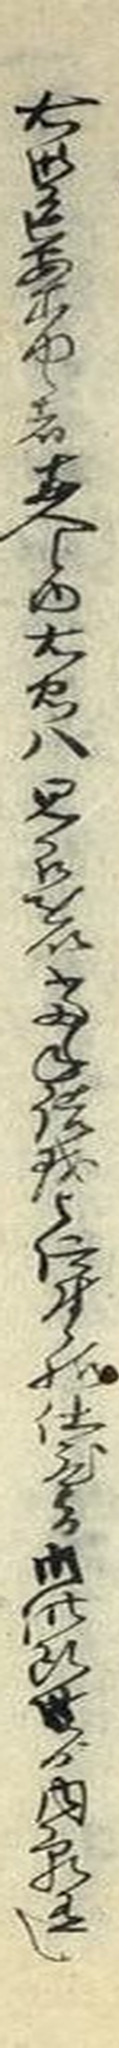右御道案内之者両人之内右忠八思召を以当年詰越被仰付候様仕度旨御供頭ゟ内願有之
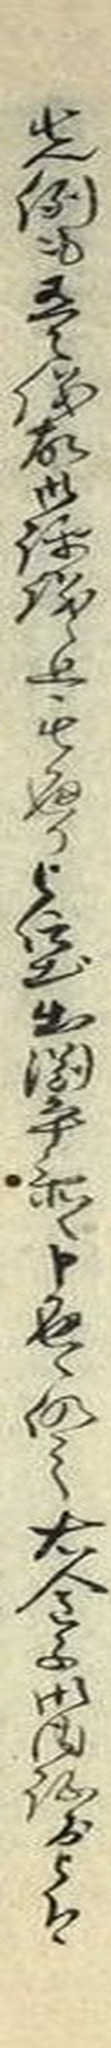先例も有之儀故御評議之上其通り被仰出出淵平兵衛へ申通候依之右金子御内証ゟ被下候
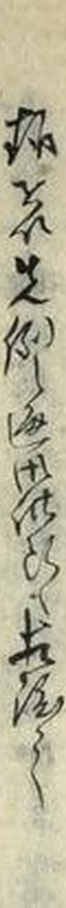趣を以先例之通御供頭へ相渡之
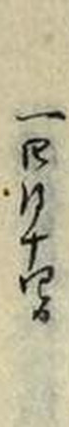一四月十四日

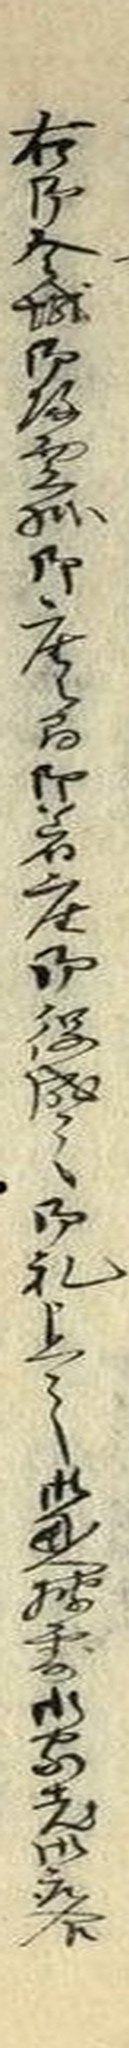右御登城御帰殿掛御座之間御着座御役成之御礼申上之御用人披露御家老御取合
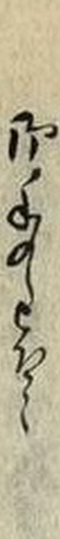御手のし被下之
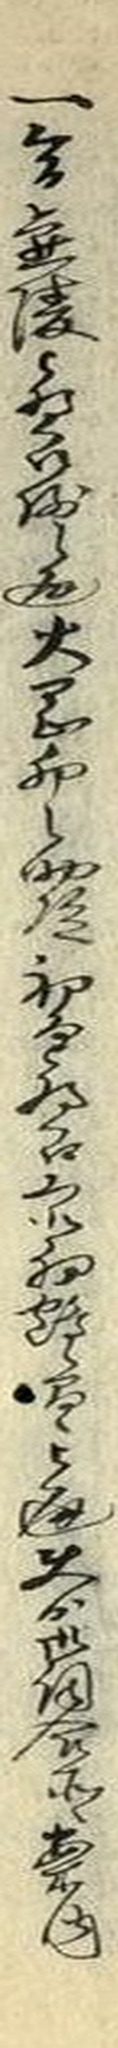一今日燕凌被為召例之通大岡卯之助殿初而被為召最初鶴之間へ被通夫ゟ御調合所へ案内
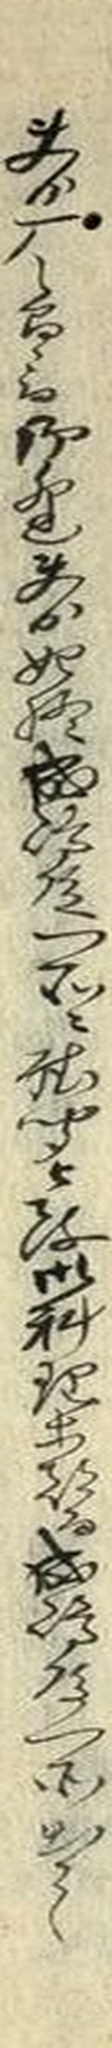夫ゟ雁之間ニ而御逢夫ゟ始終成嶋殿一所ニ聴聞被致御料理等都而成嶋殿一所出之
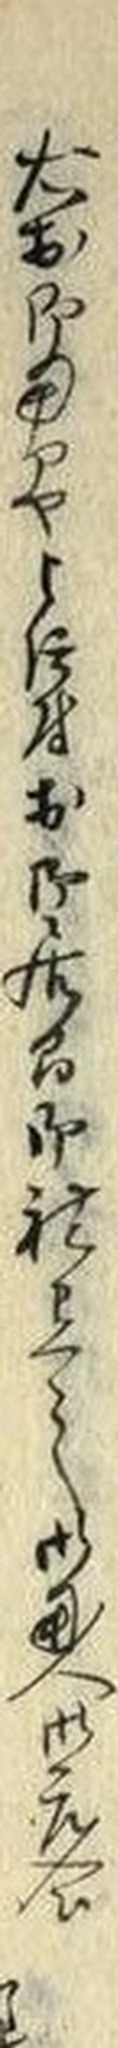右於御用部屋被仰付於御居間御礼申上之御用人御取合
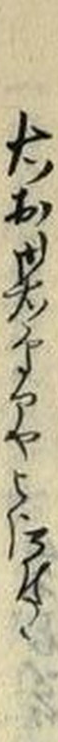右於御右筆部屋被仰付候
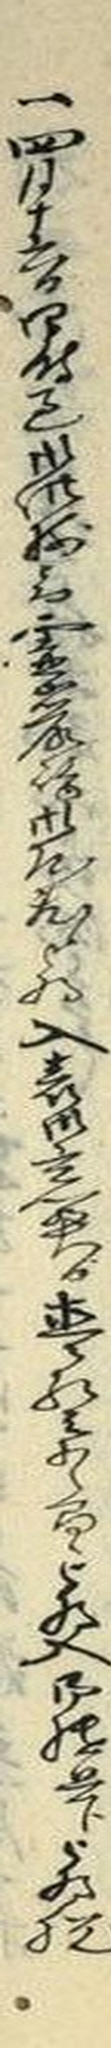一四月十六日四時過御供揃ニ而霊厳嶋御屋敷へ被為入表御玄関ゟ直ニ紅葉之間へ被為入御継上下被為脱
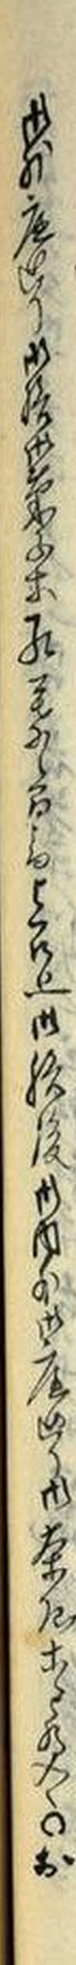御外庭廻り御膳御菓子等紅葉之間ニ而被召上御膳後御内外御庭廻り御茶屋等へ被為入候〇於
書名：少傅日録抄（斉善付側向頭取日記、在府）
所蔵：福井県文書館 Fukui Prefectural Archives
